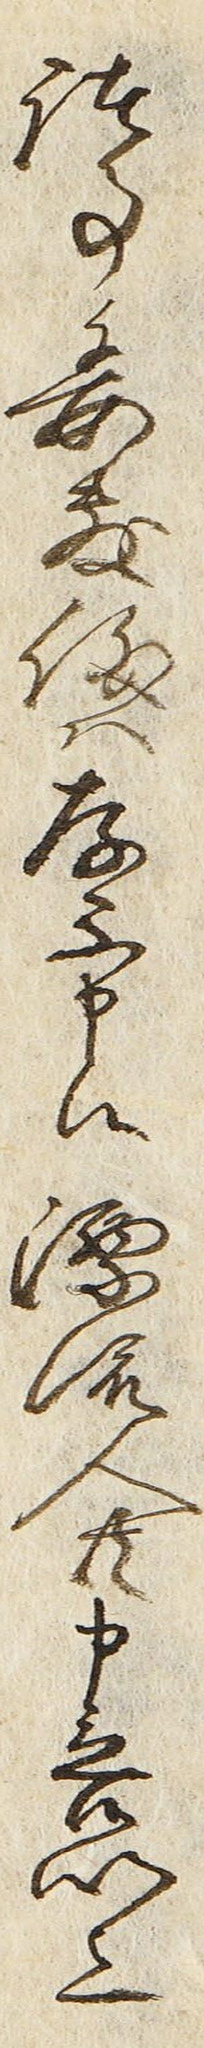諸事委敷儀は存不申候漂流人共申立候已上
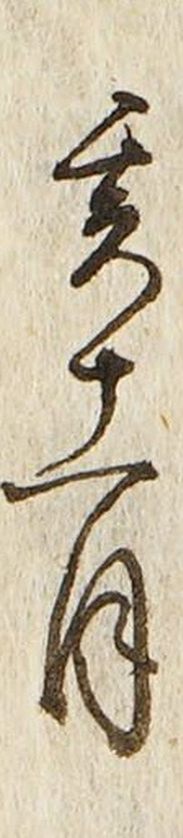亥十一月
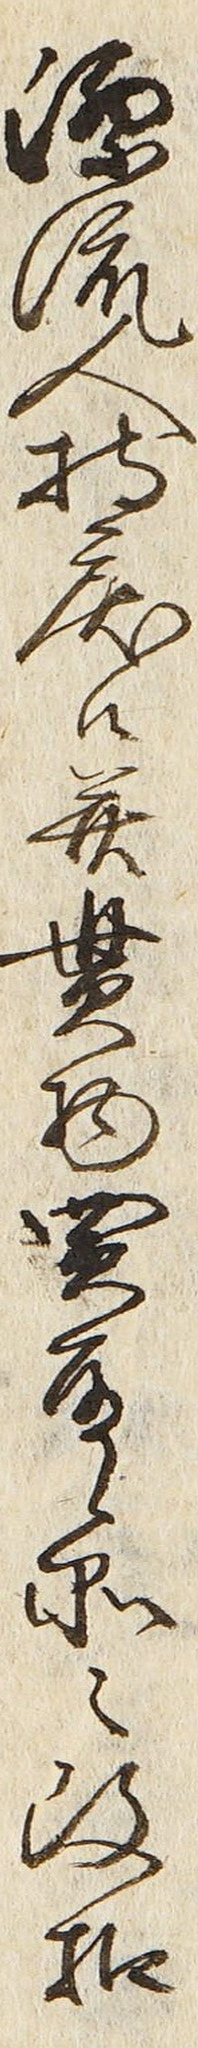漂流人持戻候并貰物買取候品々改扣
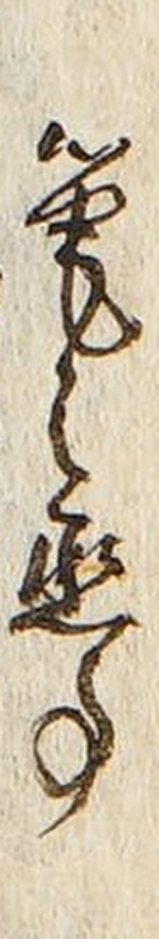筆之丞事
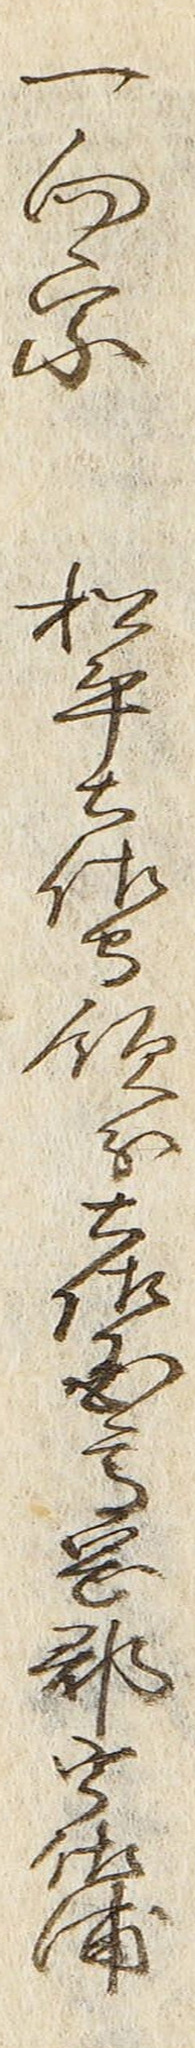一向宗松平土佐守領分土佐国高岡郡宇佐浦伝蔵
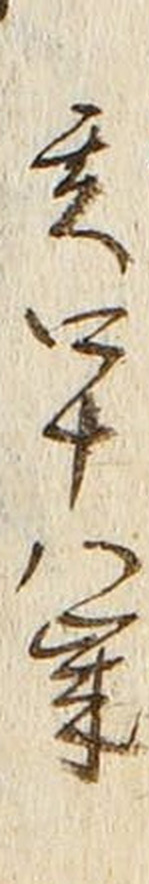亥四十八歳
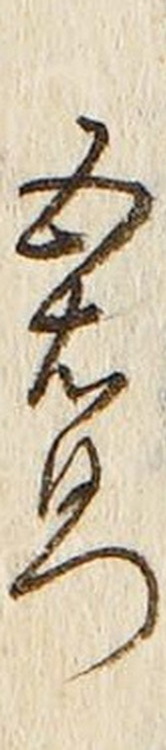五右衛門
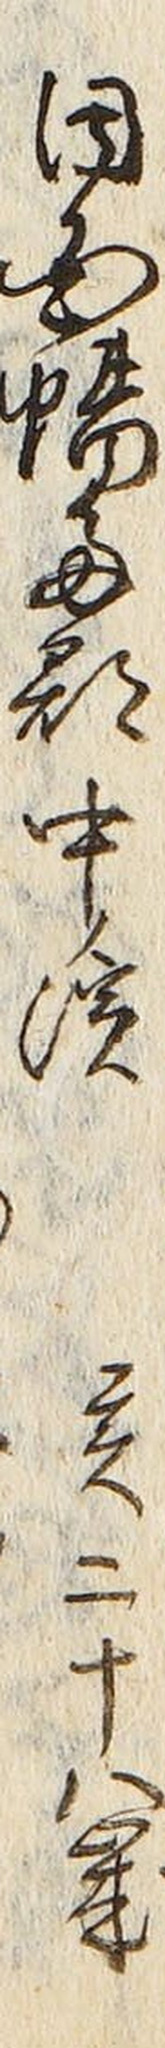同宗同国幡多郡中ノ浜亥二十八歳
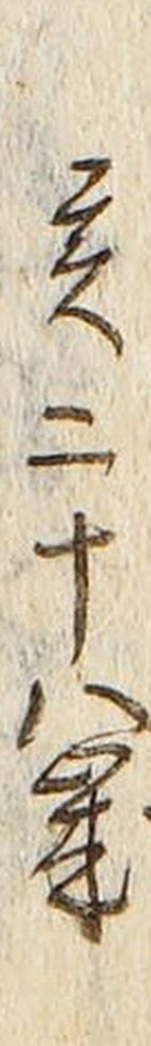亥四十八歳
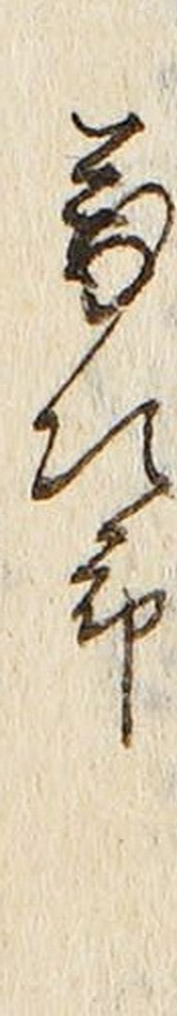万次郎
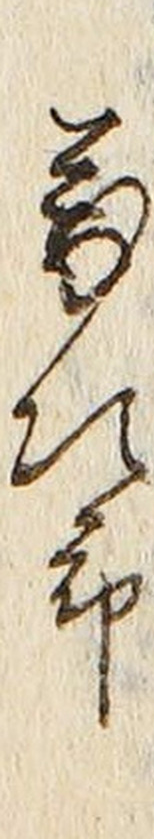万次郎
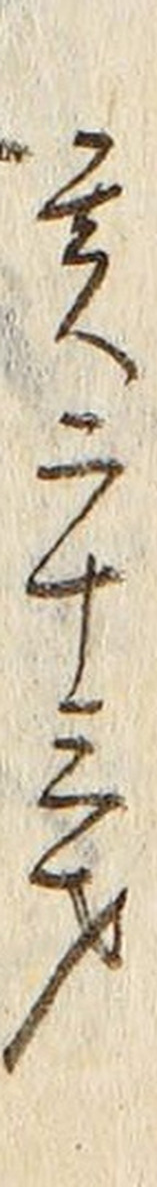亥二十三歳
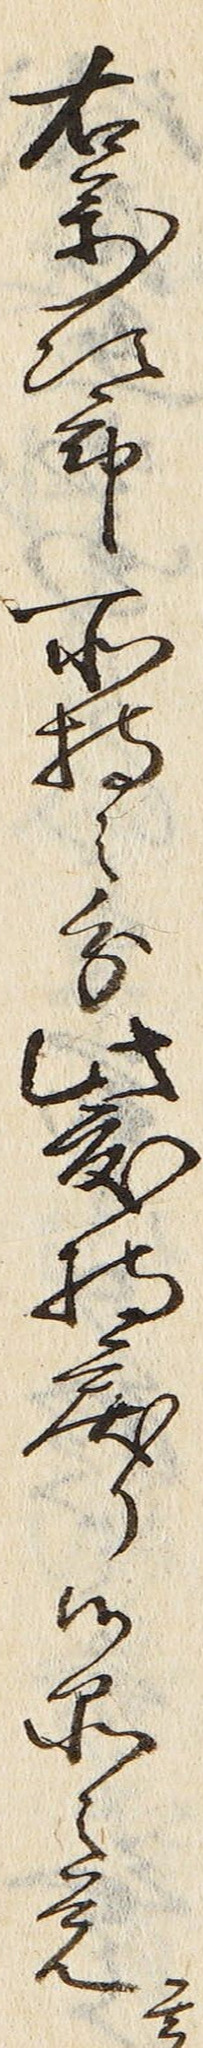右万次郎所持之分此度持戻り候品之覚
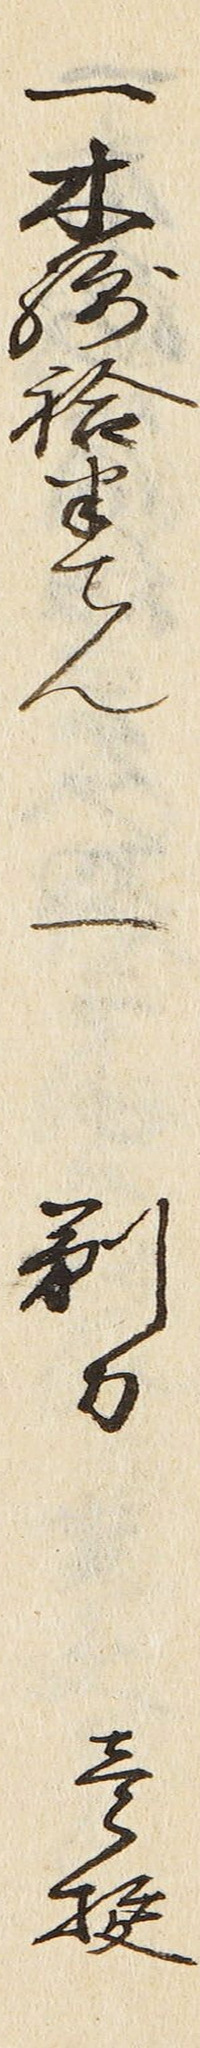一木綿袷半てん一剃刀壱挺
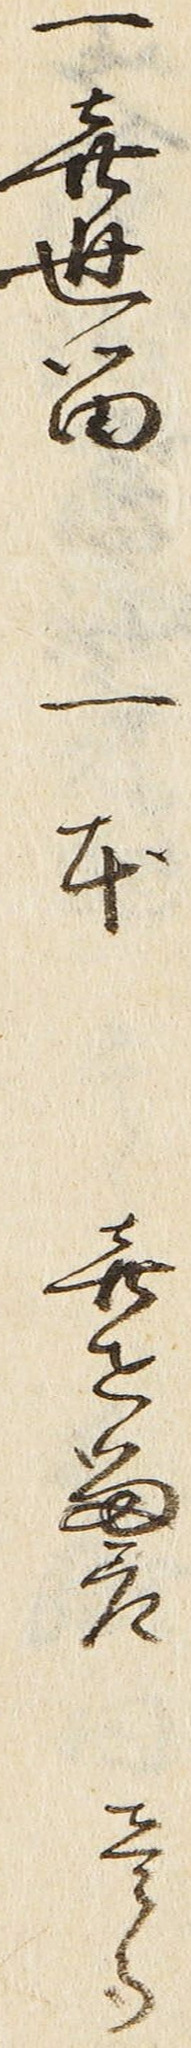一喜世留一本喜世留差壱つ
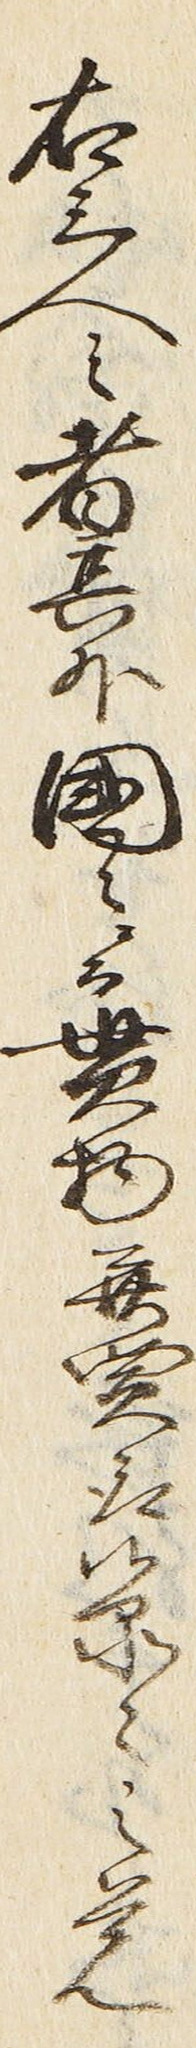右三人之者其外国々に而貰物并買取候品々之覚
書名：土佐中浜万次郎漂流記
